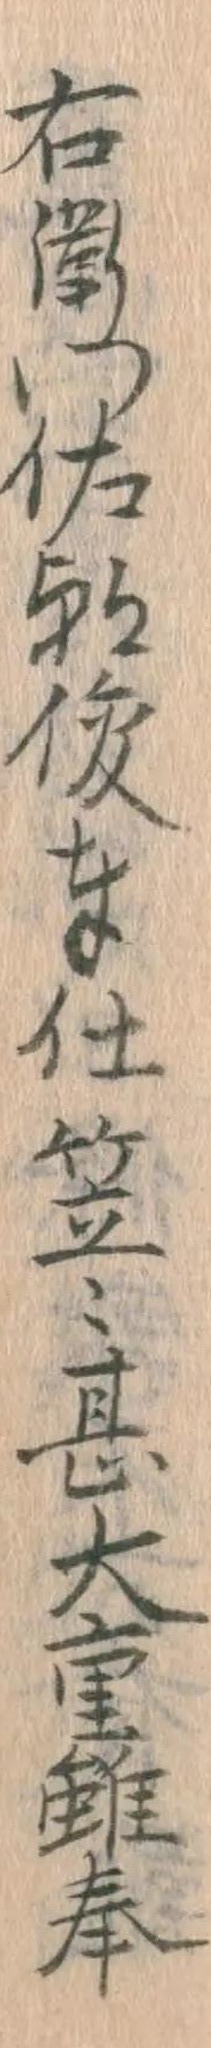右衛門佐朝俊奉仕笠々甚大重雖奉
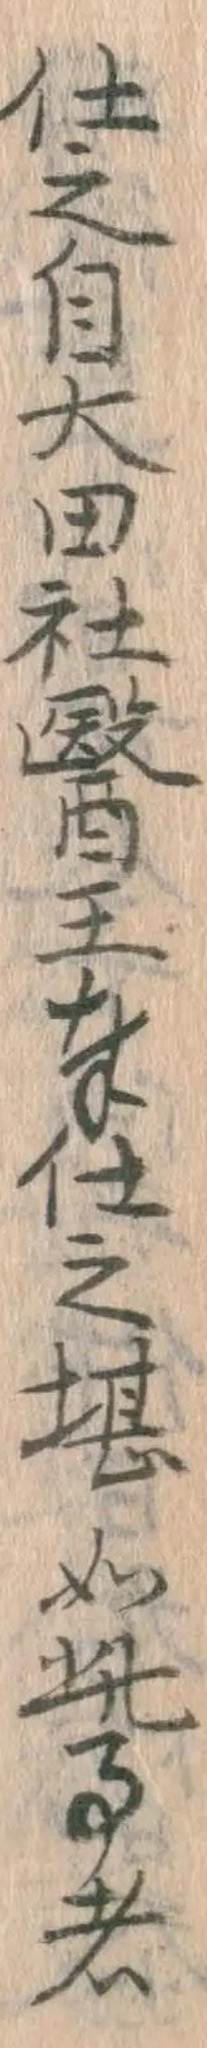仕之自大田社医王奉仕之堪如此事者
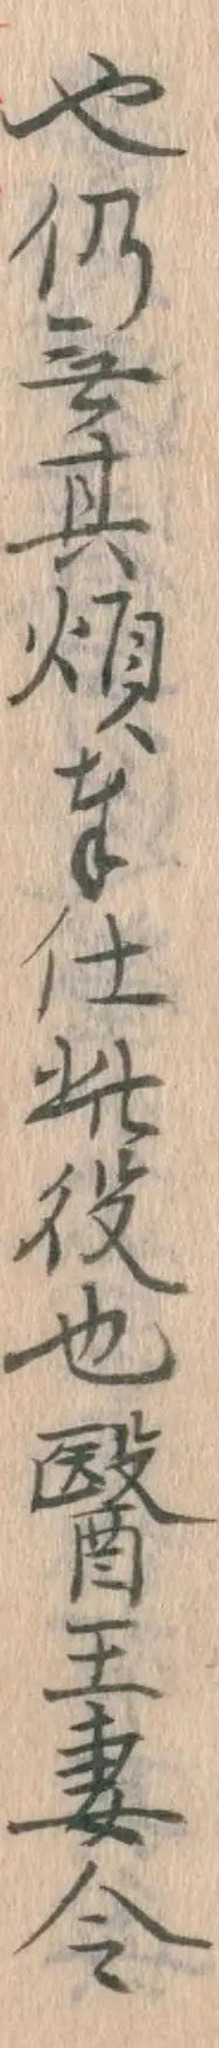也仍無其煩奉仕此役也医王妻令
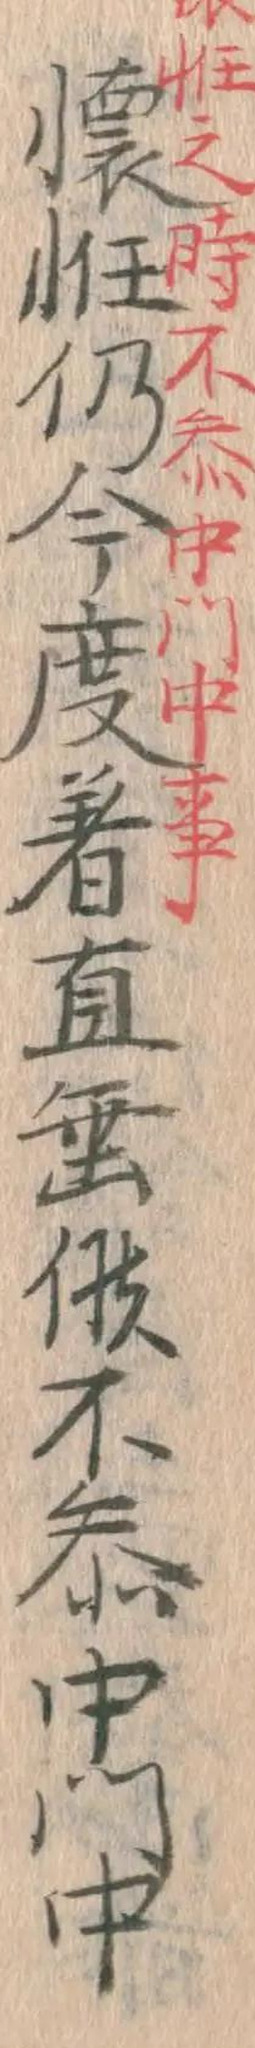懐㤛仍今度着直垂候不参中門中
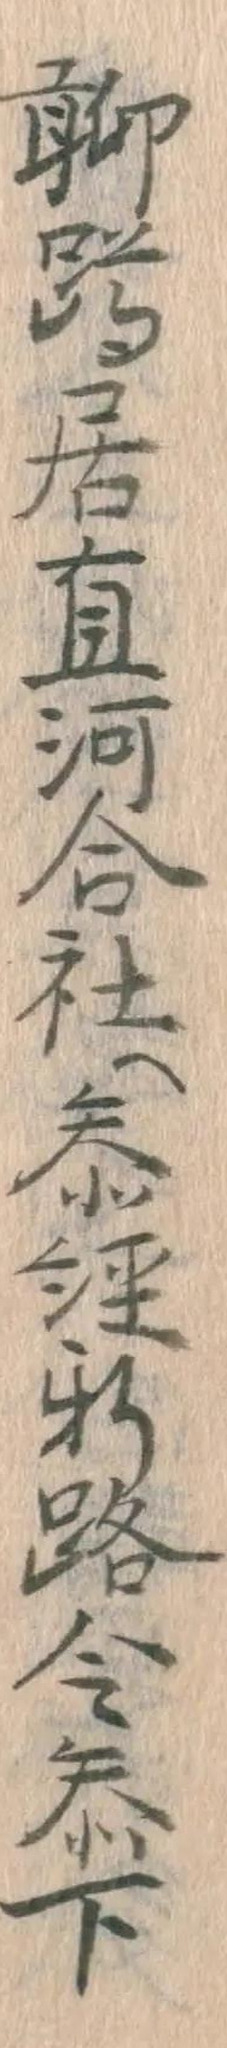聊蹲居直河合社へ参経新路令参下
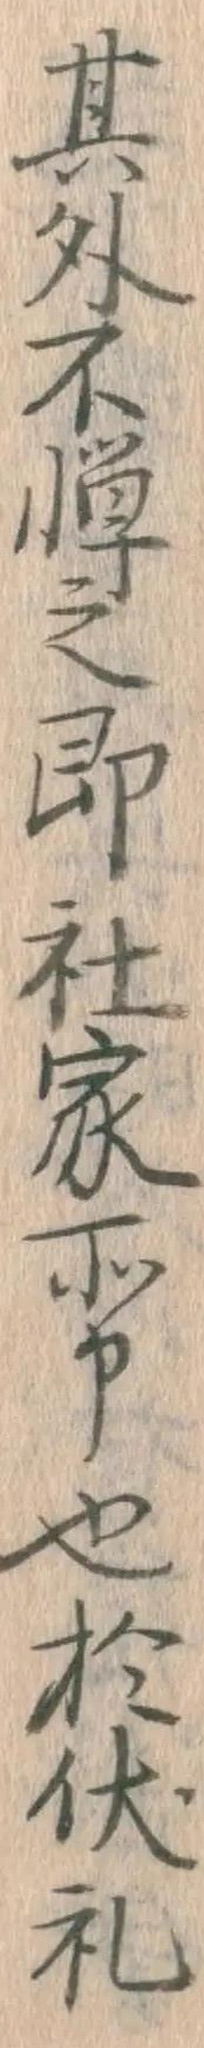其外不憚之即社家所申也於伏礼
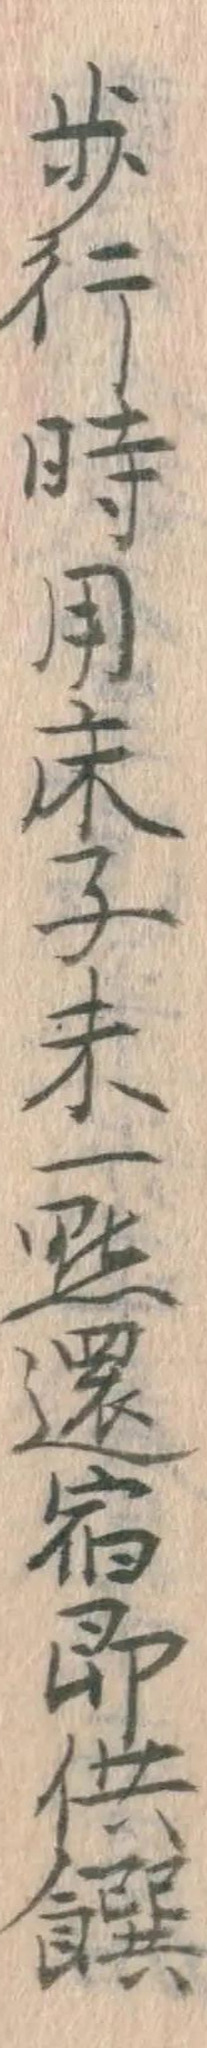歩行時用床子未一点還宿即供饌
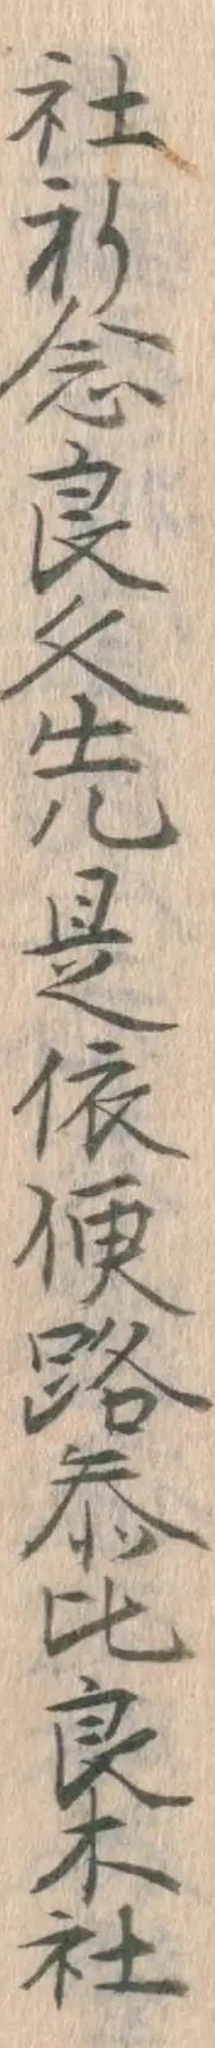社祈念良久先是依便路参比良木社
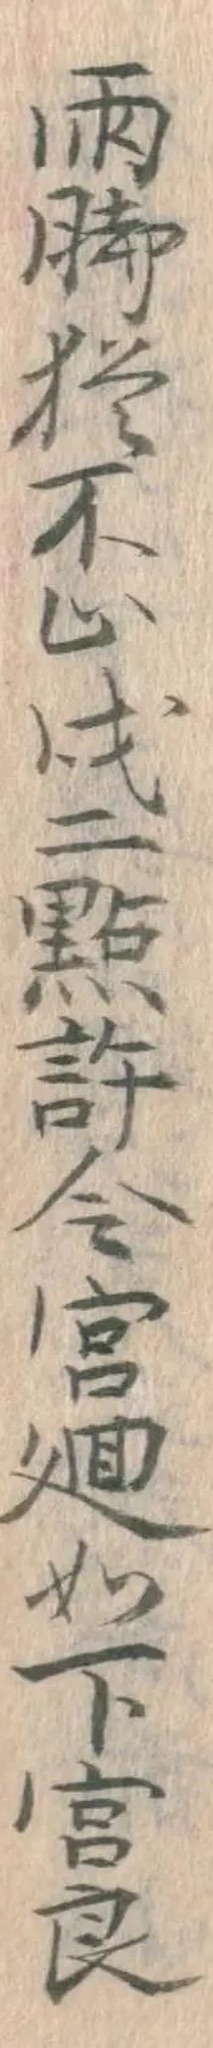雨脚猶不止戌二点許令宮廻如下宮良
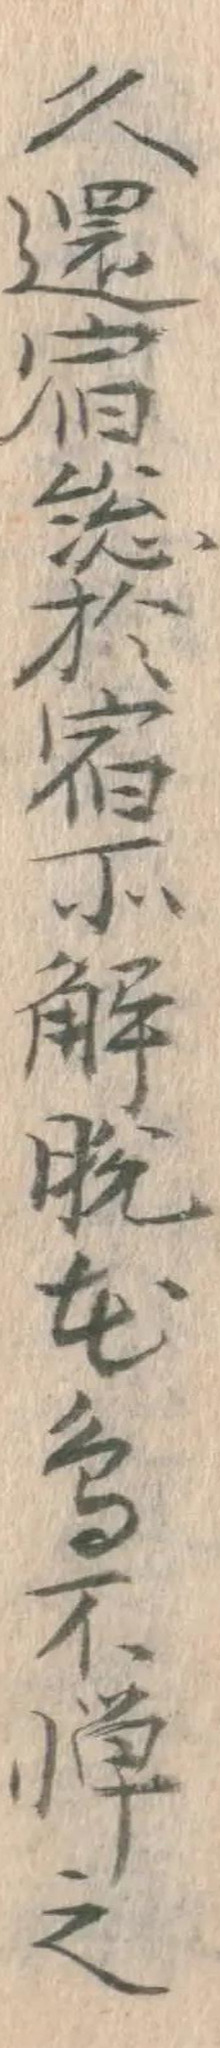久還宿総於宿所解脱花鳥不憚之
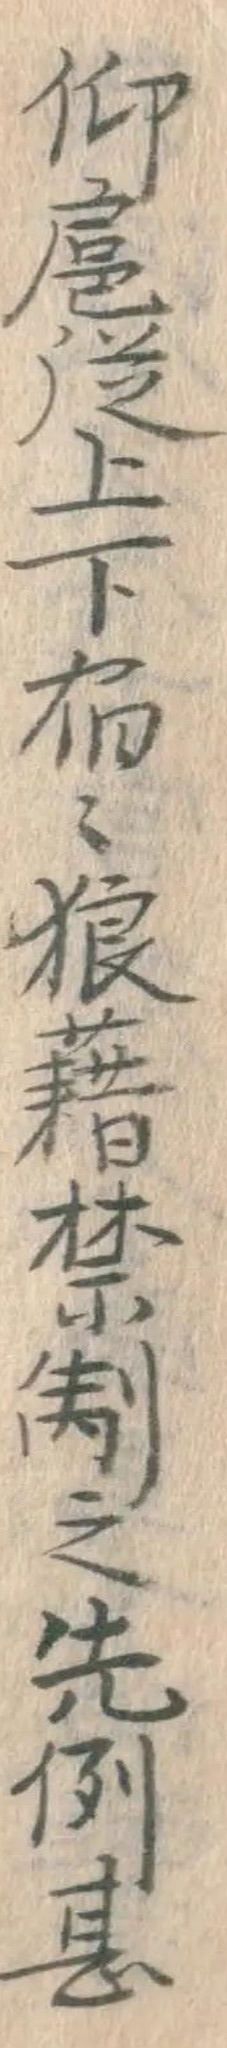仰扈従上下宿々狼藉禁制之先例甚
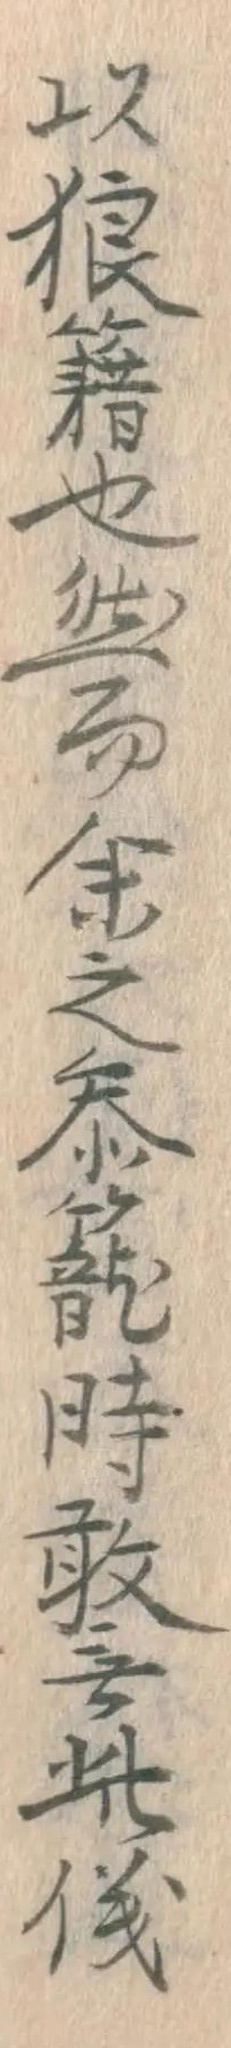以狼藉也然而余之参籠時敢無此儀
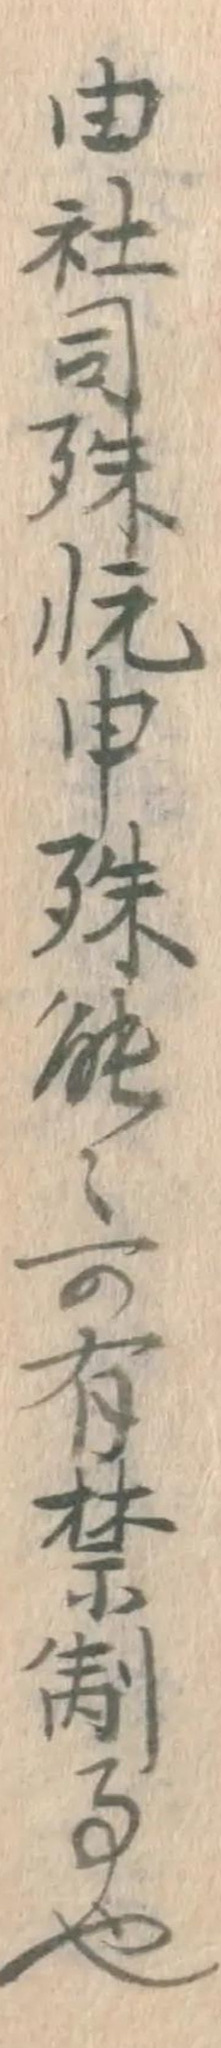由社司殊悦申殊能々可有禁制事也

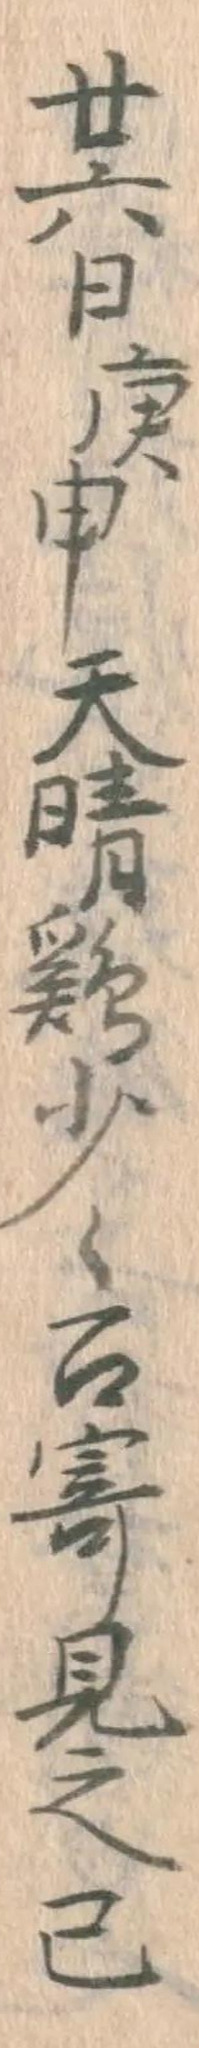廿六日庚申天晴鶏少々召寄見之巳
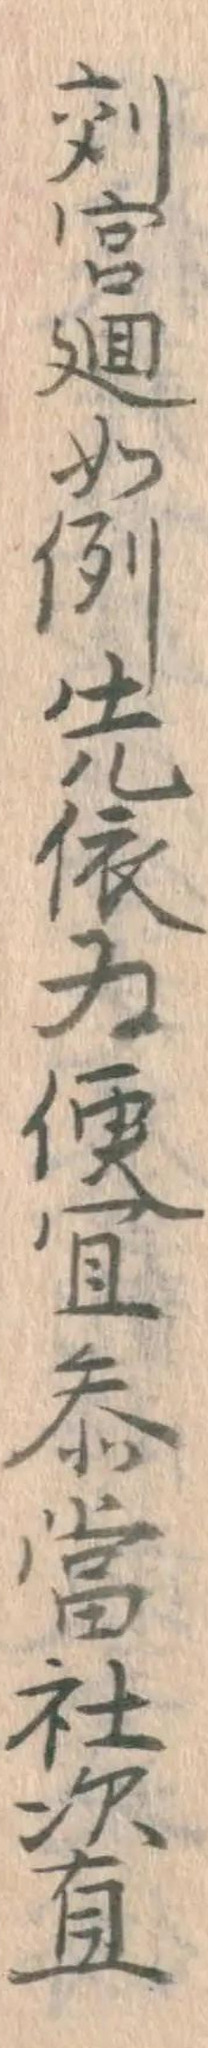刻宮廻如例先依為便宜参当社次直
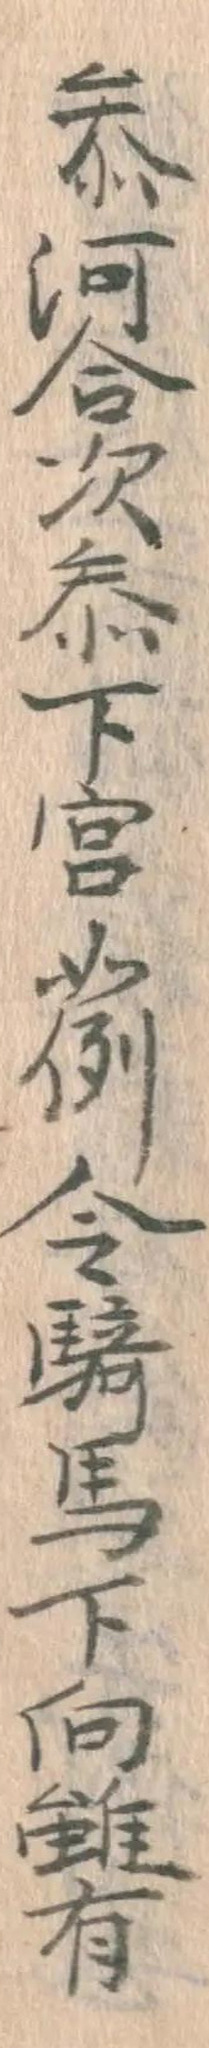参河合次参下宮如例令騎馬下向雖有
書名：賀茂社記録. 第80冊
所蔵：国立国会図書館 National Diet Library, JAPAN
